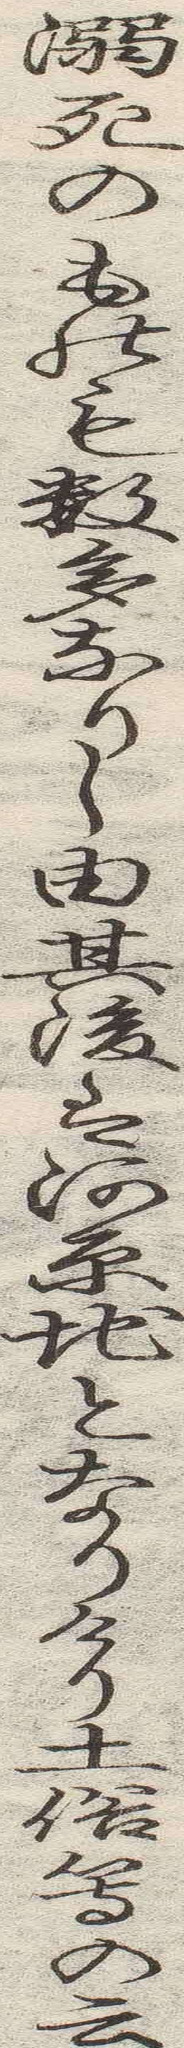溺死のものも数多なりし由其後は河原地となりけり土俗等の云
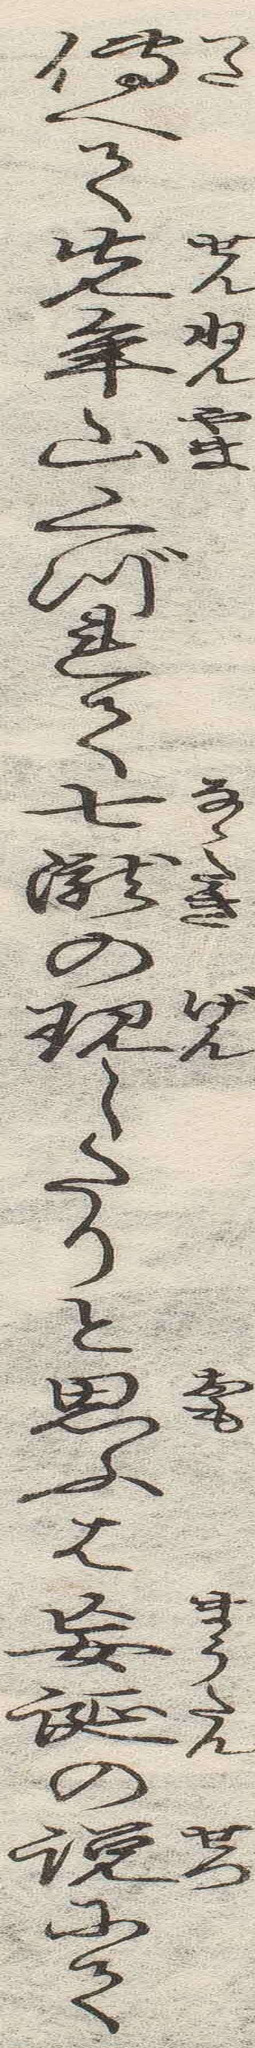傳へて先年山くづれて七瀧の現したりと思ふは妄誕の説にて
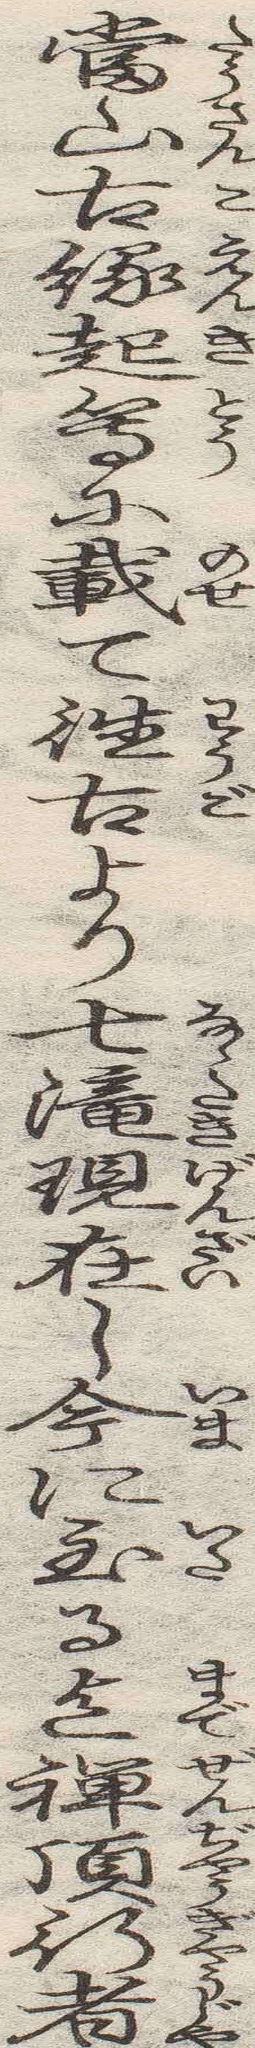當山古縁起等に載て徃古より七滝現在し今に至る迄禅頂行者
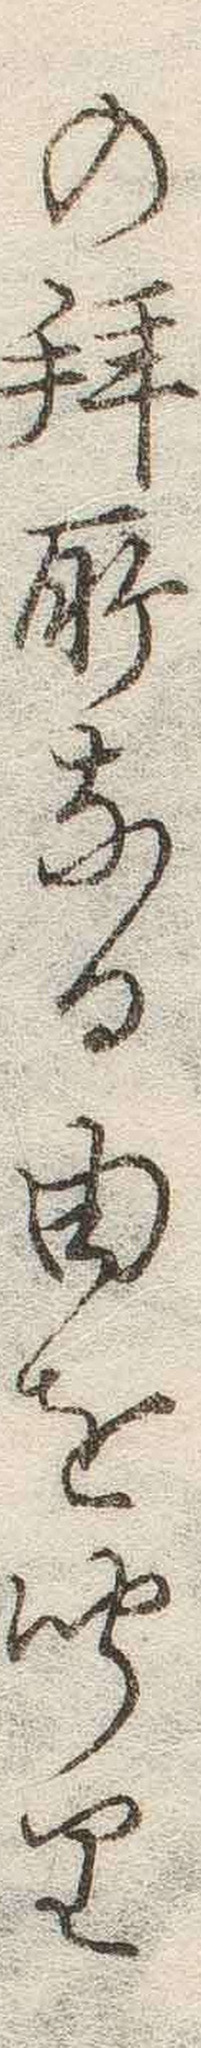の拜所なる由を聞り
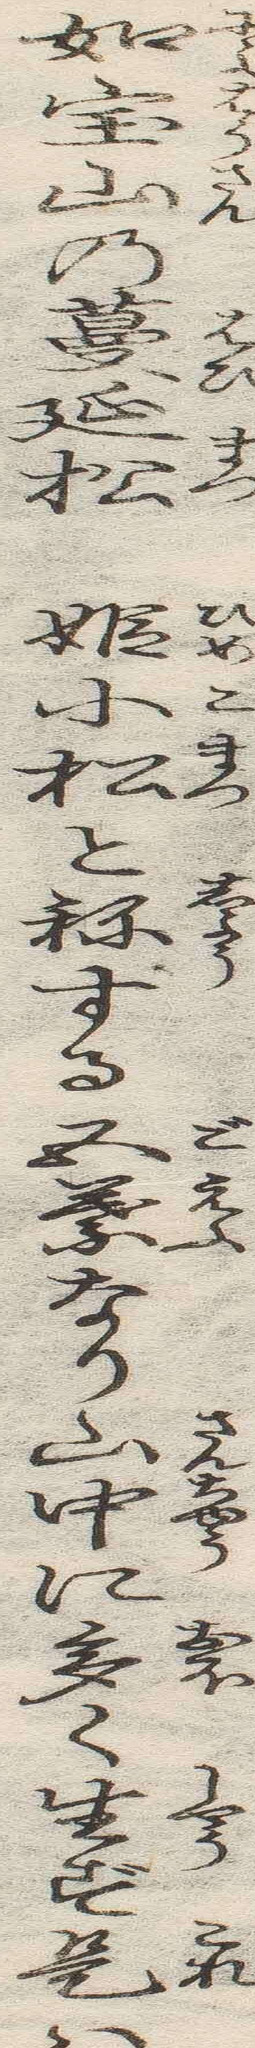如宝山の蔓延松姫小松と称する五葉なり山中に多く生ず是は
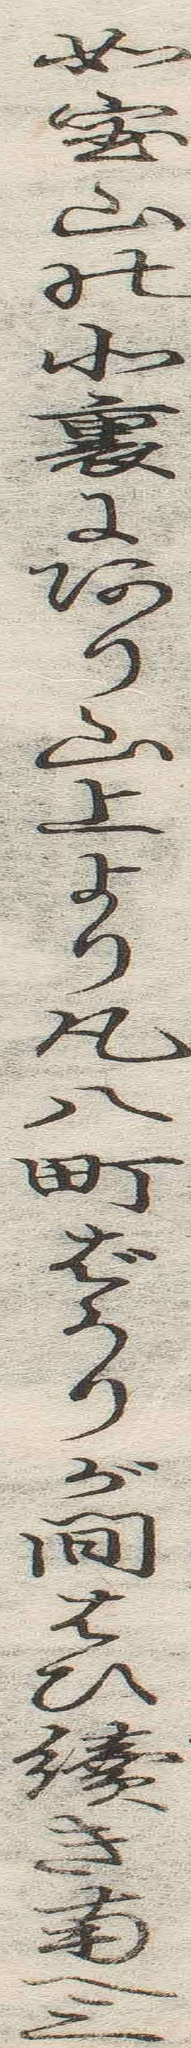如宝山の北裏にあり山上より凡八町ばかりが間はひ續き南へ三
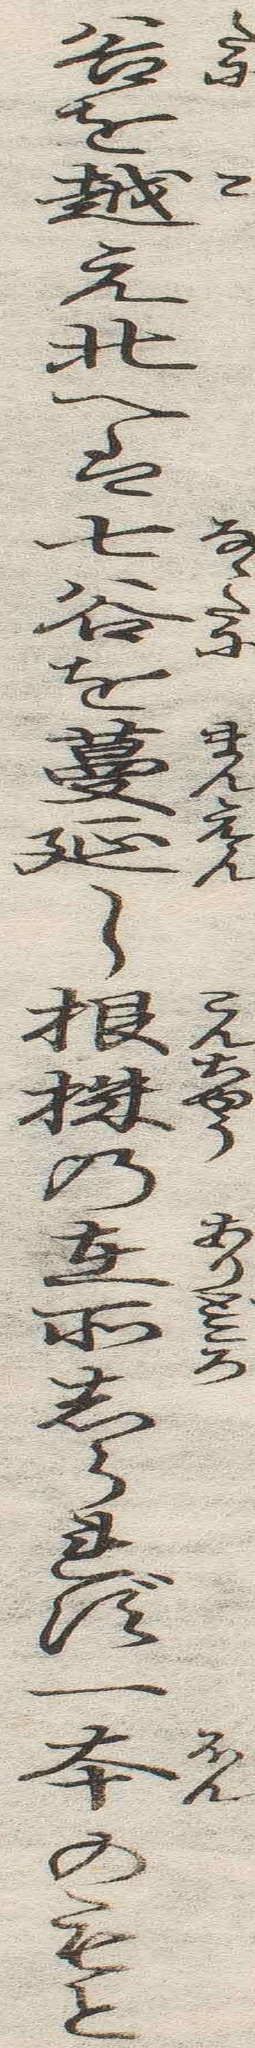谷を越え北へは七谷を蔓延し根株の在所しられず一本のもと
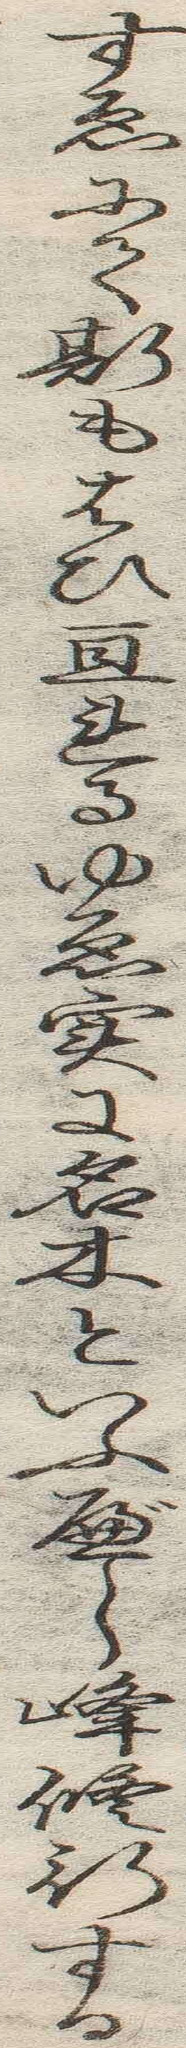すゑにて斯もはひ亘れるゆゑ実に名木といふべし峰修行する
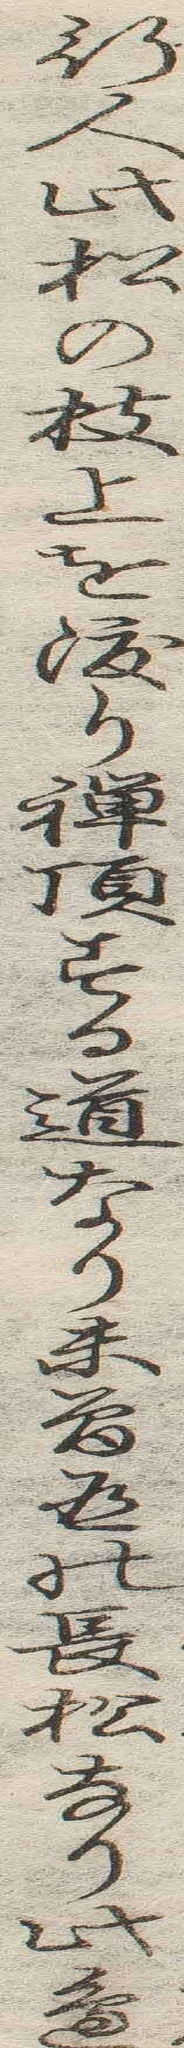行人此松の枝上を渡り禅頂する道なり未曽有の長松なり此邊
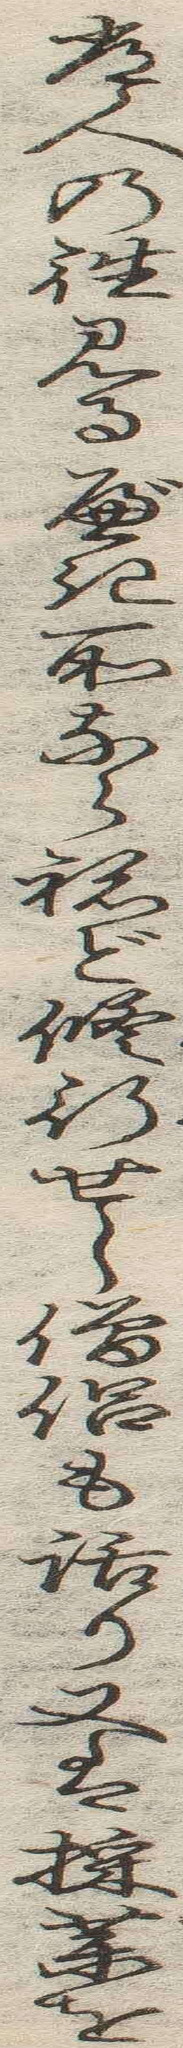常人の徃見るべき所ならねど修行せし僧侶も話り又は採薬を
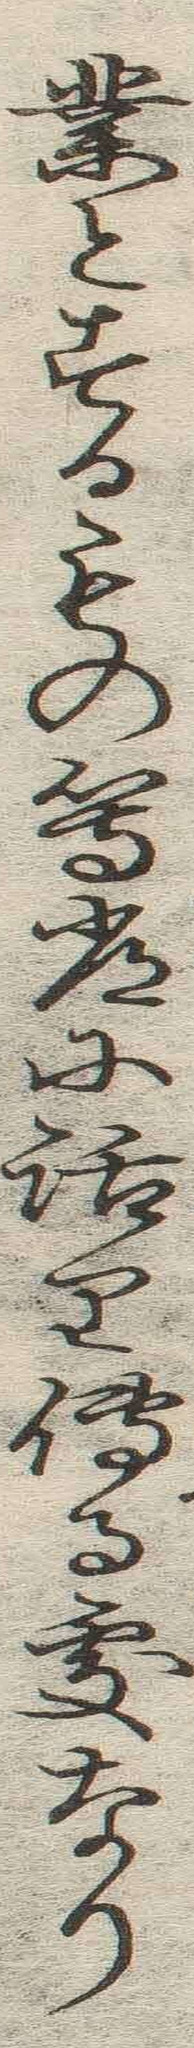業とするもの等常に話り傳る處なり

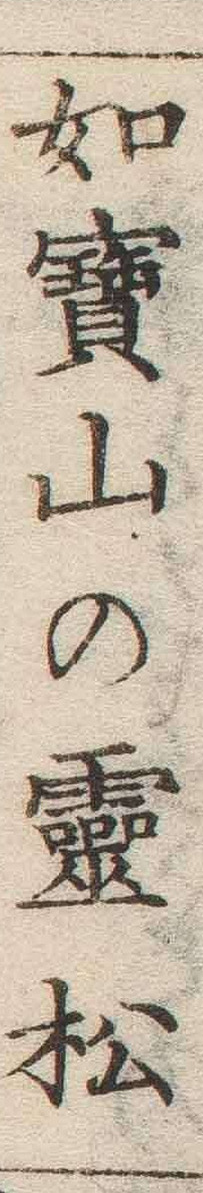如寶山の靈松

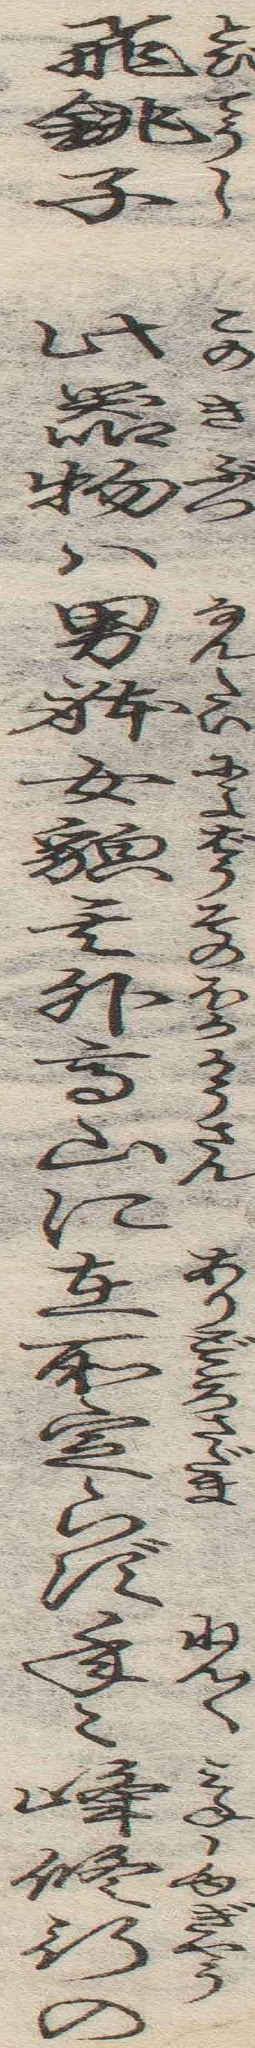飛銚子此器物は男躰女貌其外高山に在所定らず年〻峰修行の
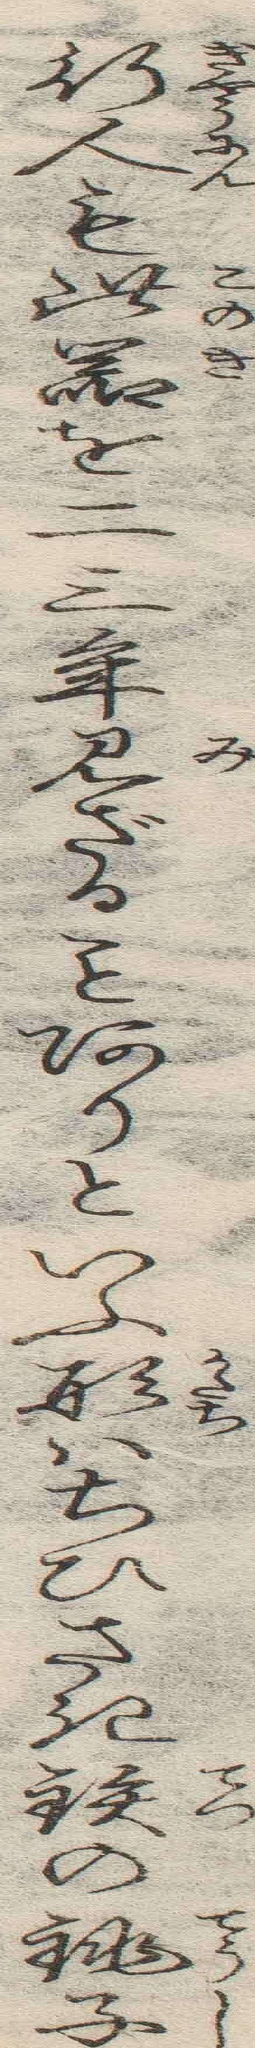行人も此器を二三年見ざることありといふ形はちひさき鉄の銚子
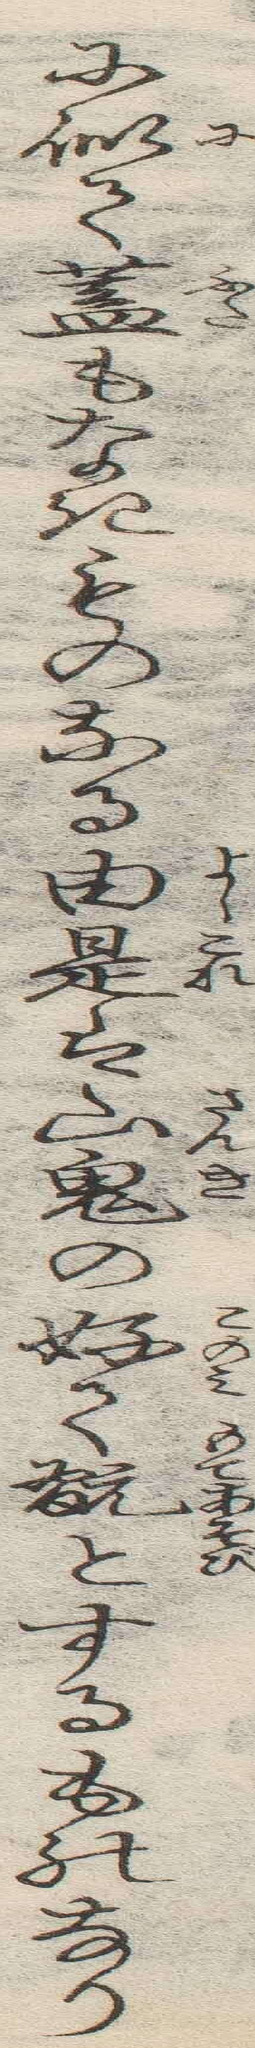に似て蓋もなきものなる由是は山鬼の好て翫とするものなり
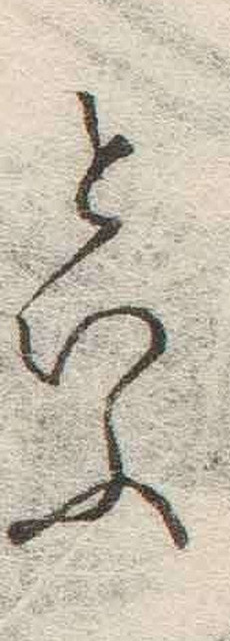といふ
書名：日光山志
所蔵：東京学芸大学附属図書館 国文学研究資料館
